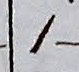1
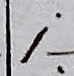1
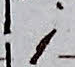1
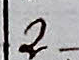2
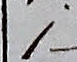1
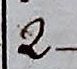2
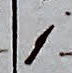1
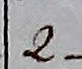2
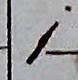1
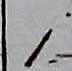1
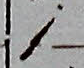1
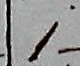1
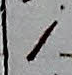1
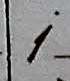1
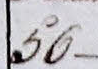56
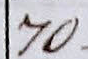70
